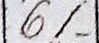61
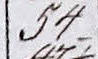54
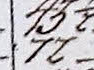72
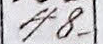48
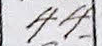44
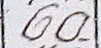60
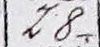28
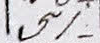51
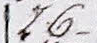26
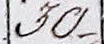30
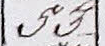53
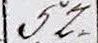52
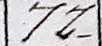72
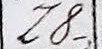28
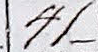41
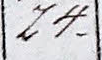24
